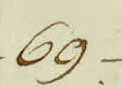69
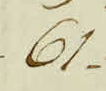61
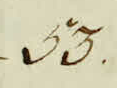53
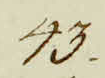43
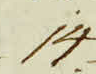14
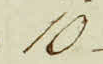10
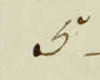5
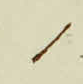1
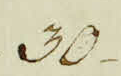30
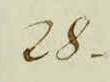28
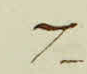7
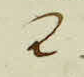2
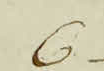6
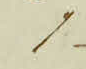1
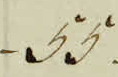55
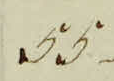55
